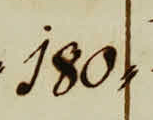180
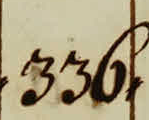336
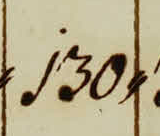130
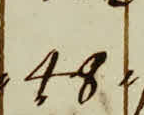48
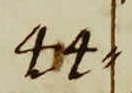44
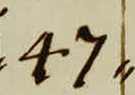47
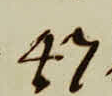47
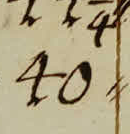40
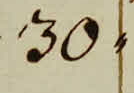30
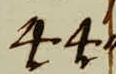44
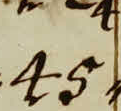45
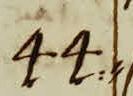44:
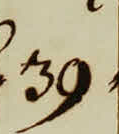39
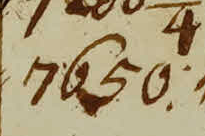7650.
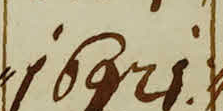16921
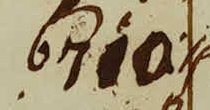6710
